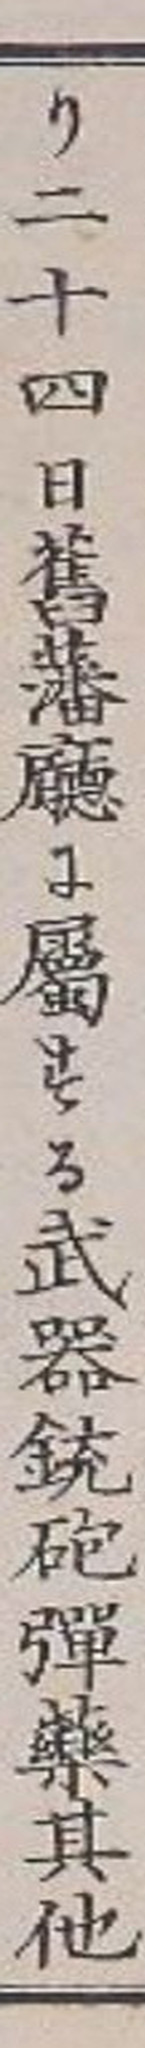り二十四日旧藩廟に属する武器銃砲弾薬其他
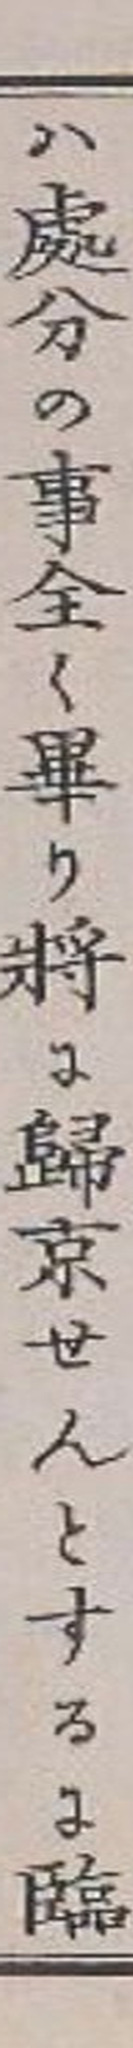は処分の事全く畢り将に帰京せんとするに臨
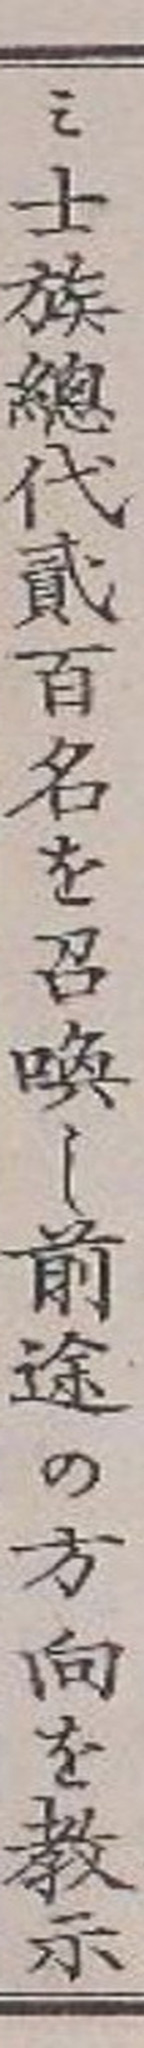み士族総代二百名を召喚し前途の方向を教示

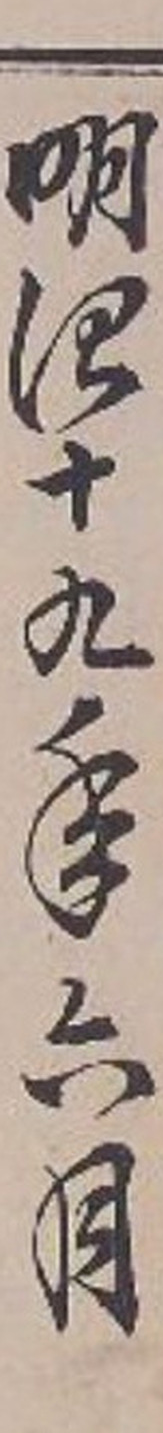明治十九年六月
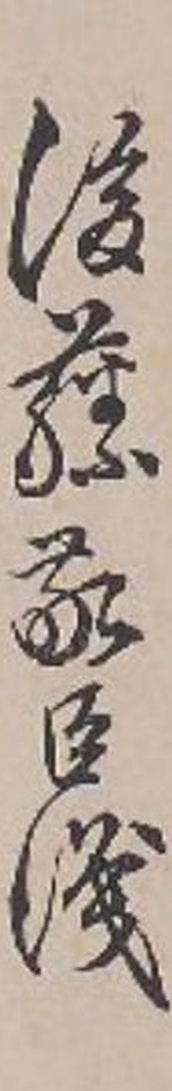後藤敬臣識
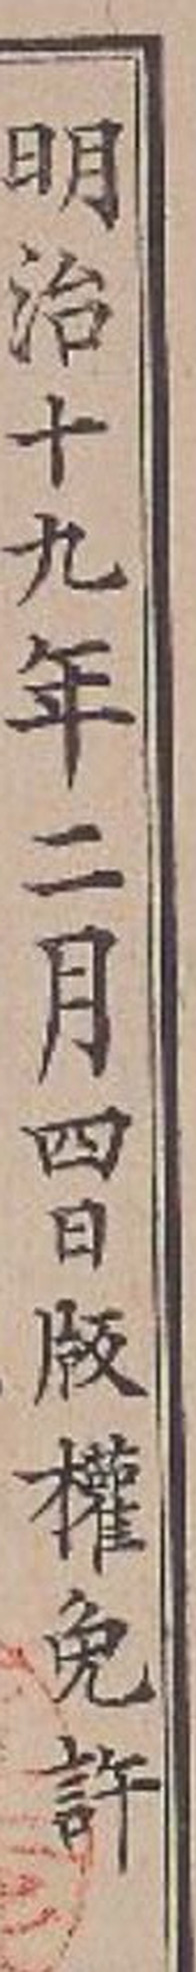明治十九年二月四日版権免許
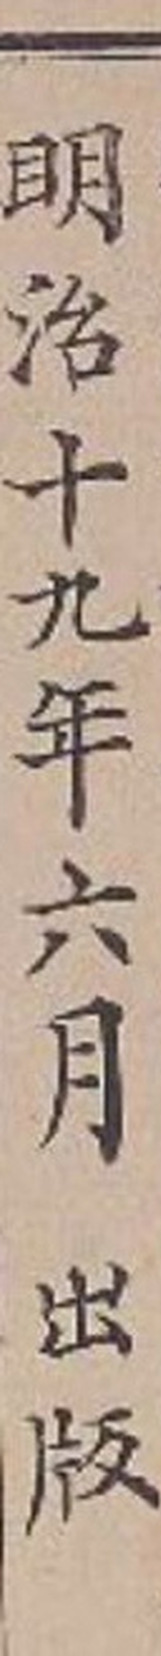明治十九年六月出版
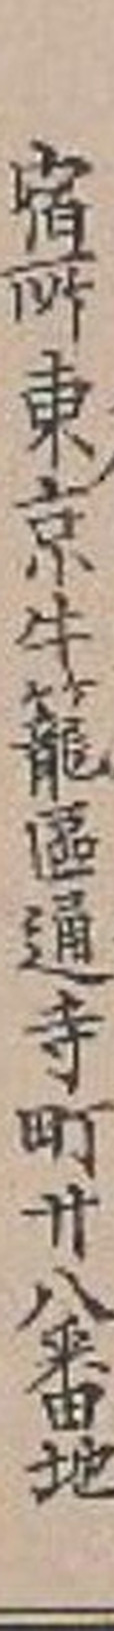宿所東京牛籠区通寺町廿八番地
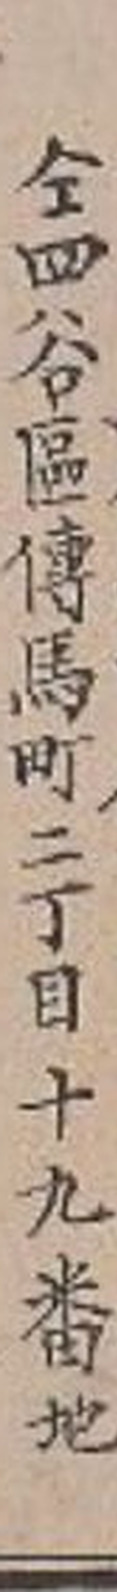同四谷区伝馬町二丁目十九番地
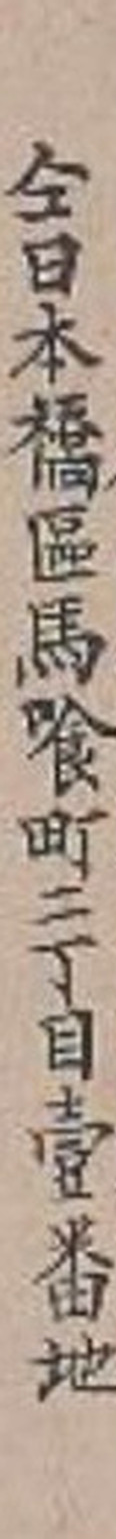同日本橋区馬喰町二丁目一番地
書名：南島紀事 下
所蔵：University of the Ryukyus Library
